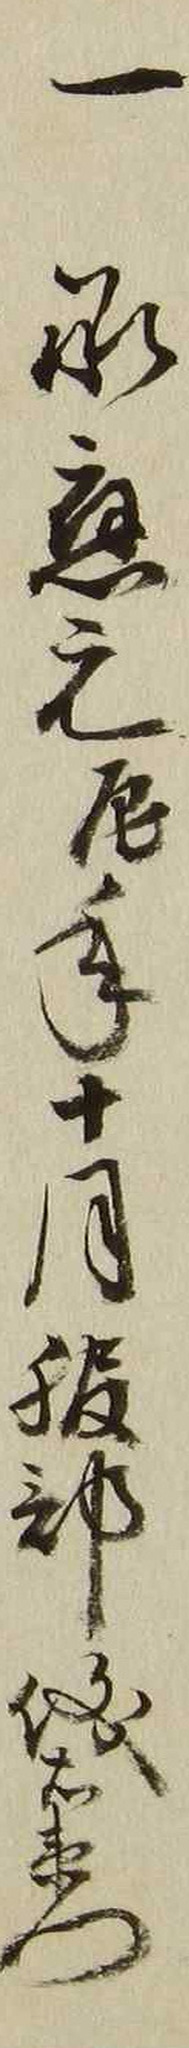一承応元辰年十月服部儀右衛門
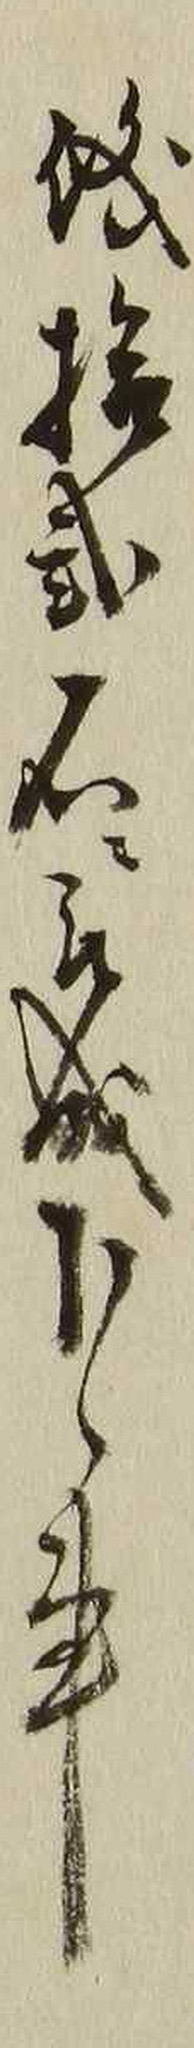儀拾弐石に被成下候事
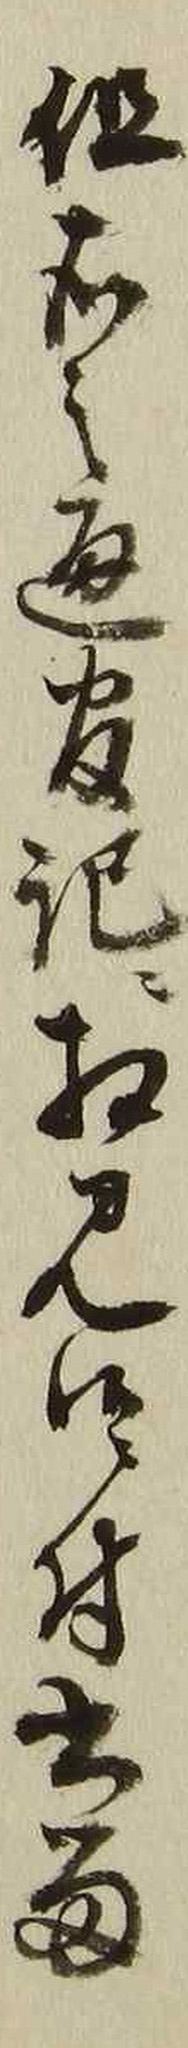但右之通官記に相見候に付書留
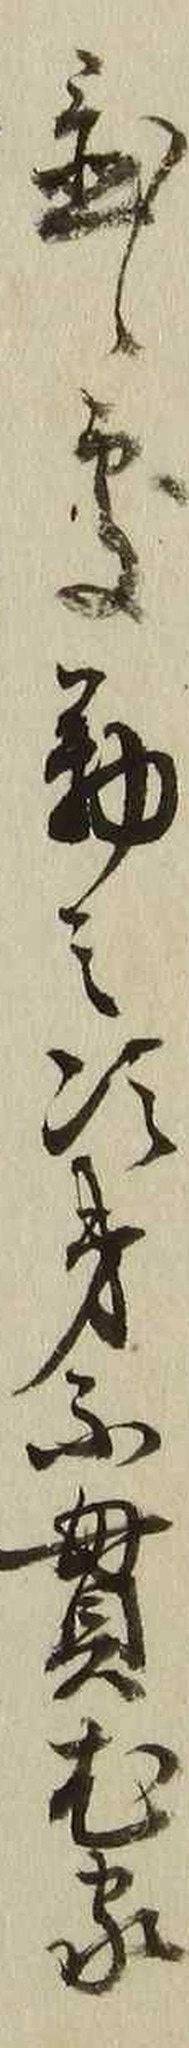置候処勤之次第不貫む家
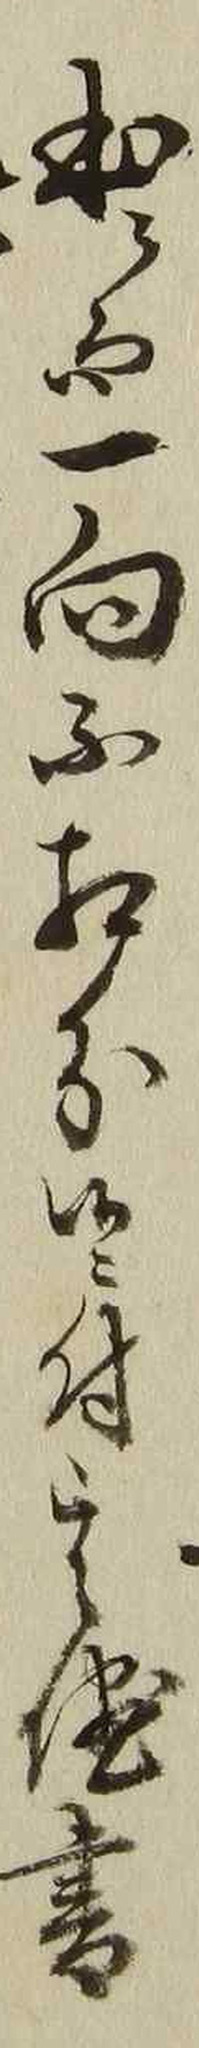本に而一向不相分候に付其侭書
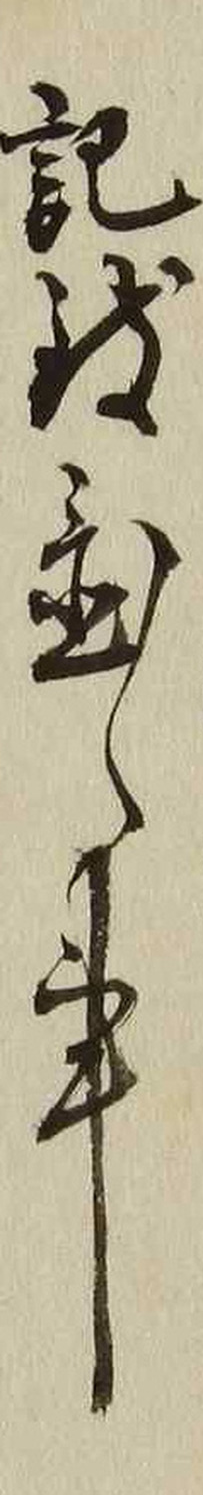記致置候事
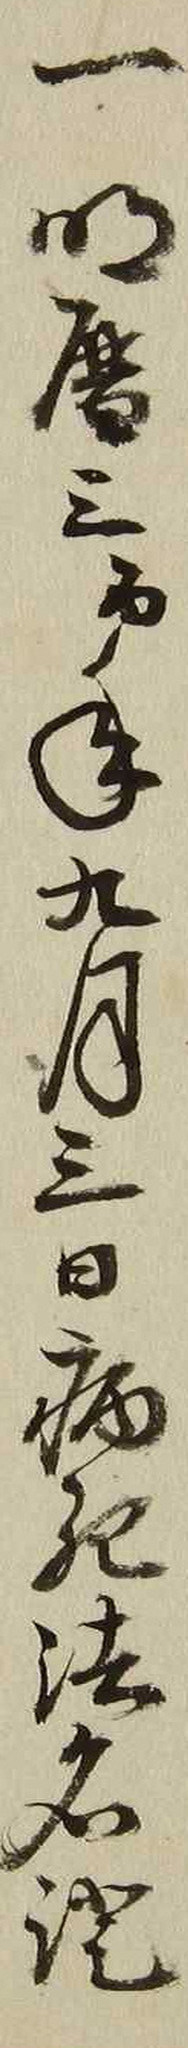一明暦三酉年九月三日病死法名證
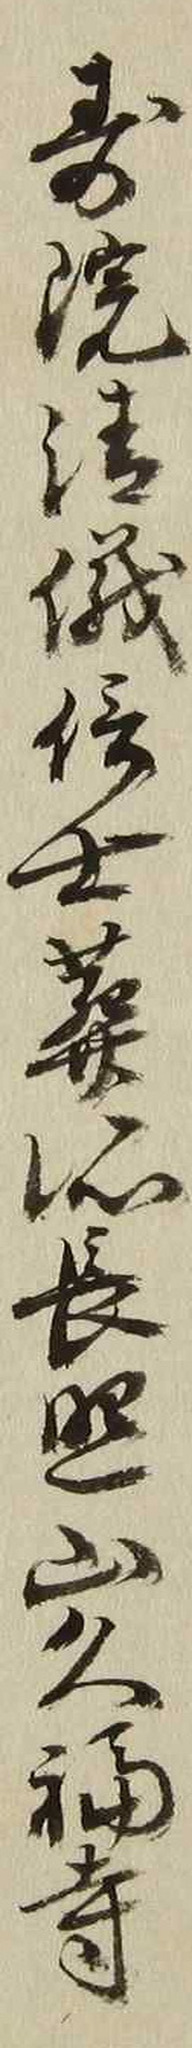寿院清儀信士葬所長照山九福寺
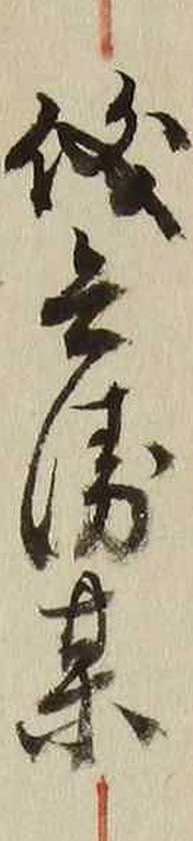儀兵衛某
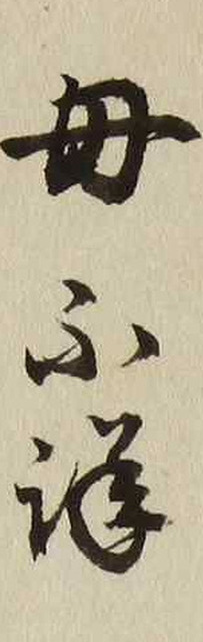母不詳
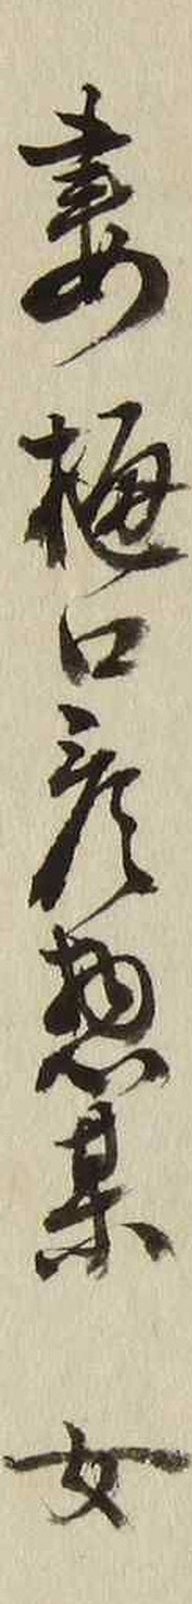妻樋口彦惣某女
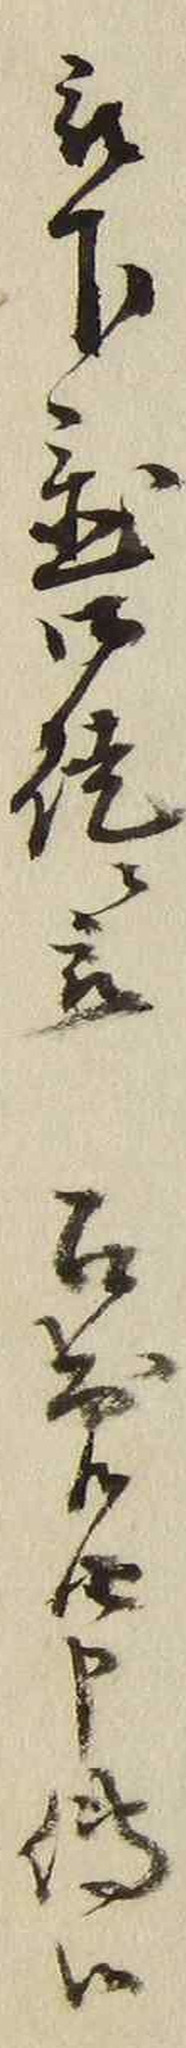被下置御徒に被召出候由申伝候

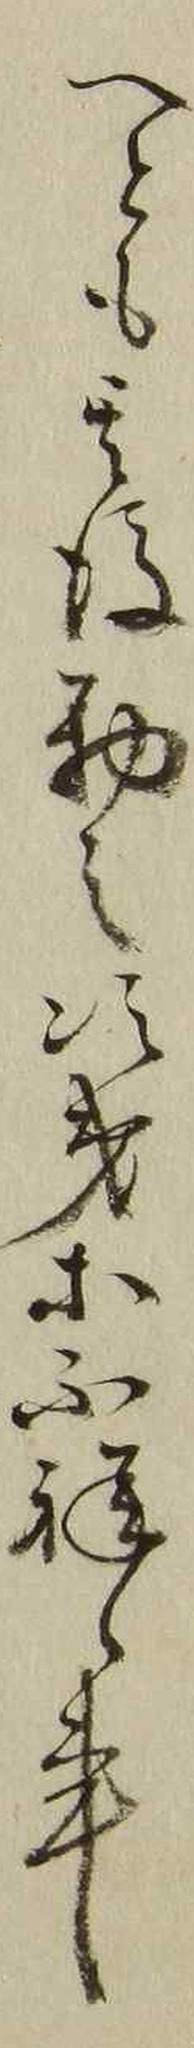へとも其後勤之次第等不詳候事
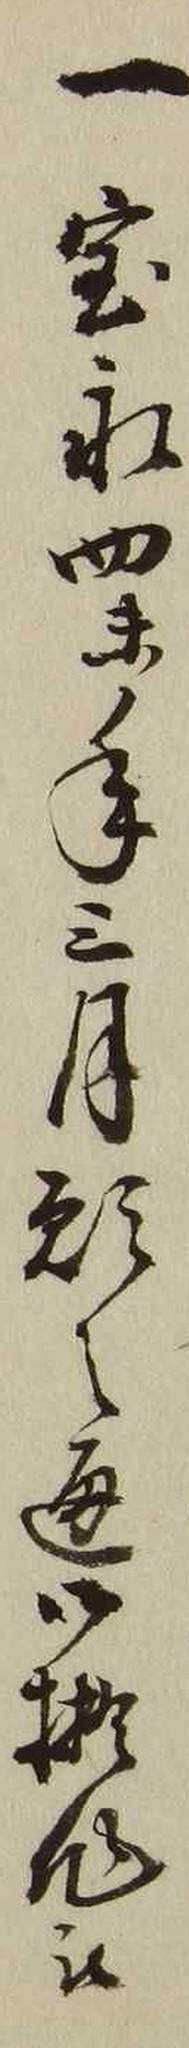一宝永四未年三月願之通御擬作被
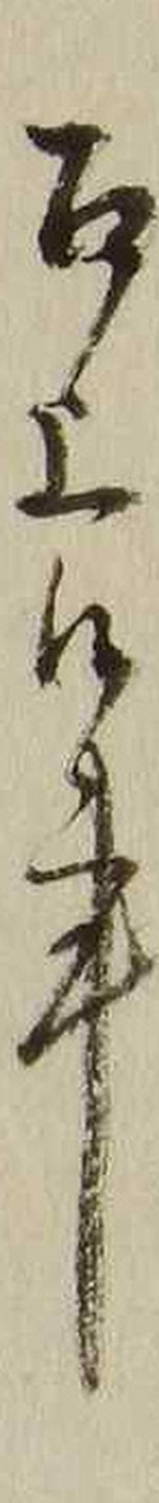召上候事
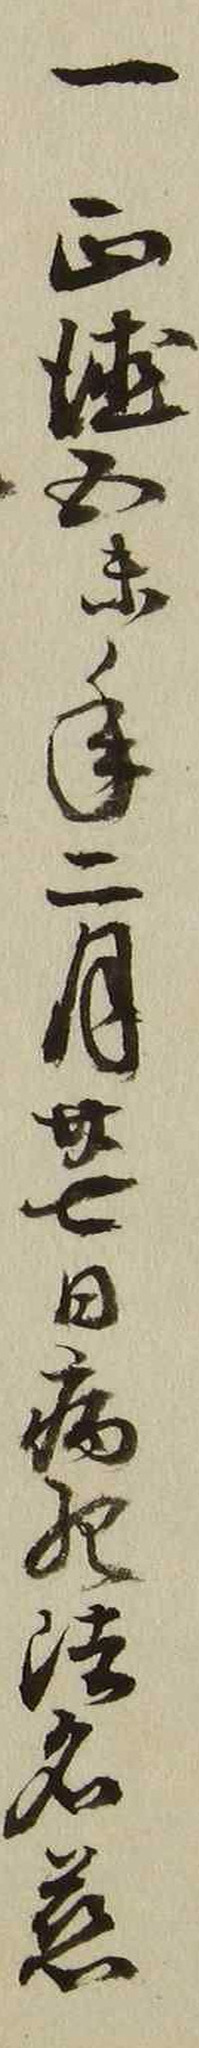一正徳五未年二月廿七日病死法名慈
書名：諸士系譜　巻之38　は之部6
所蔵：会津若松市立会津図書館
